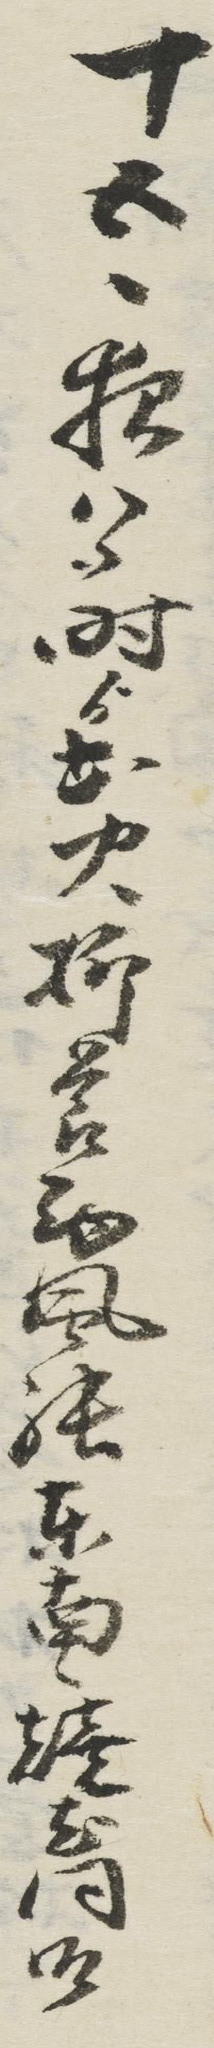十五日夜八ツ時ゟ出火折節西風張東南ヘ焼尤同町
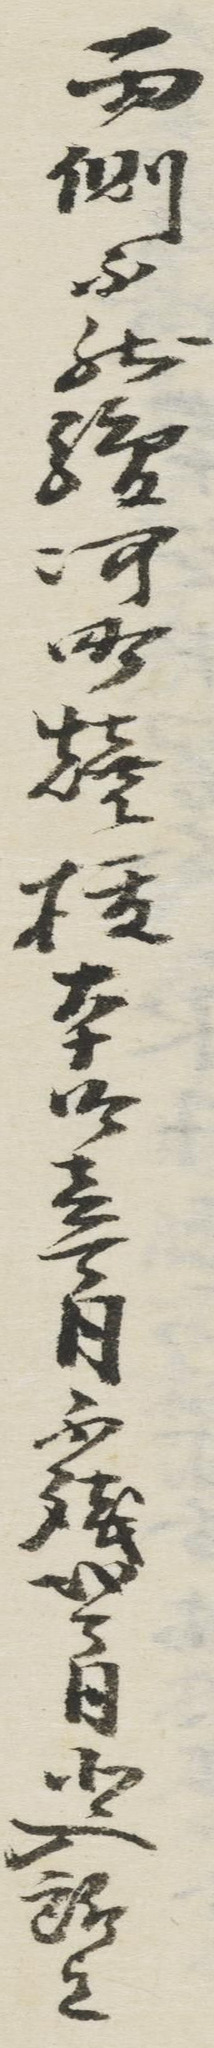両側不残駿河町焼抜本町壱丁目不残弐丁目北入所迄
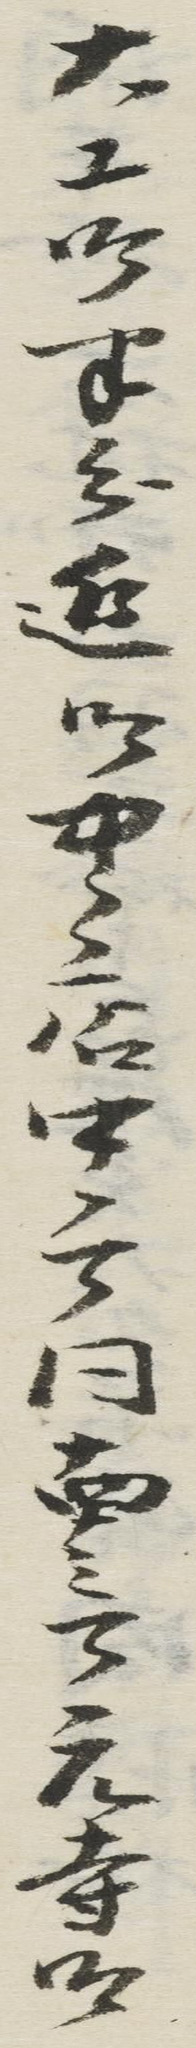大工町半分近町中ノ店中ノ丁同南三丁元寺町
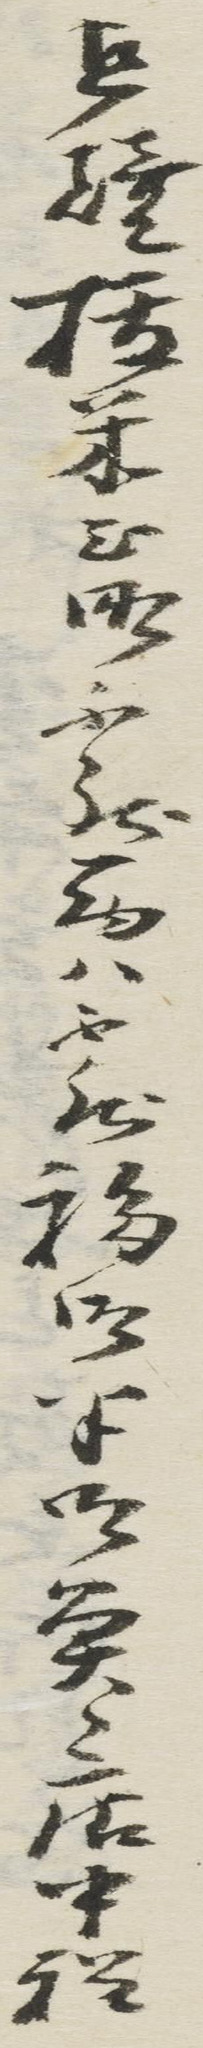迄焼抜米屋町不残西ハ不残福町半町魚ノ店中程迄
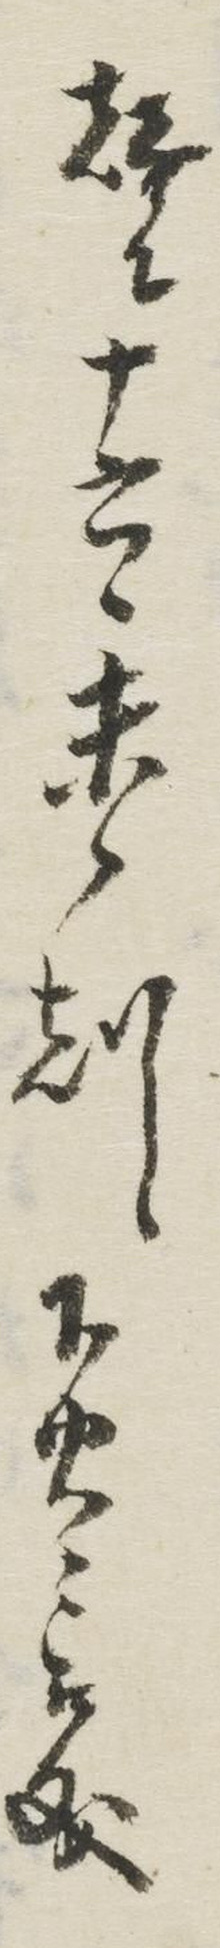焼十六日未ノ刻下火二相成

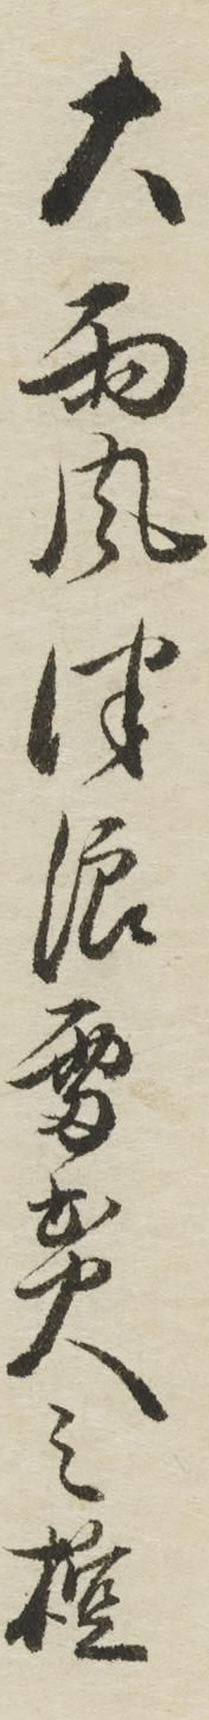大雨風津浪雷出火之控
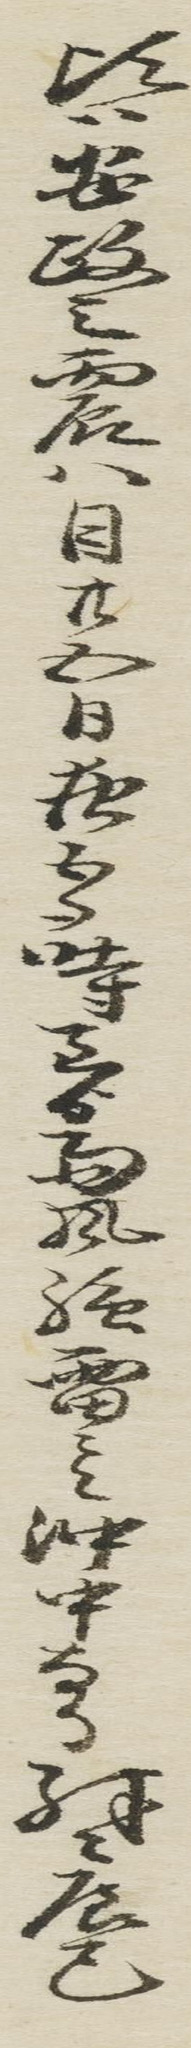頃ハ安政三丙辰八月廿五日夜五ッ時過ゟ南風強雷ニて沖中なり殊ニ辰巳
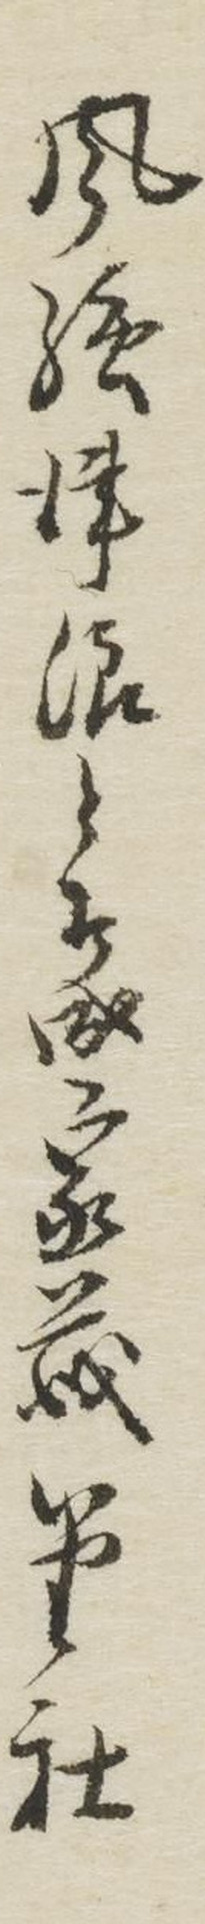風強津浪と相成家蔵堂社

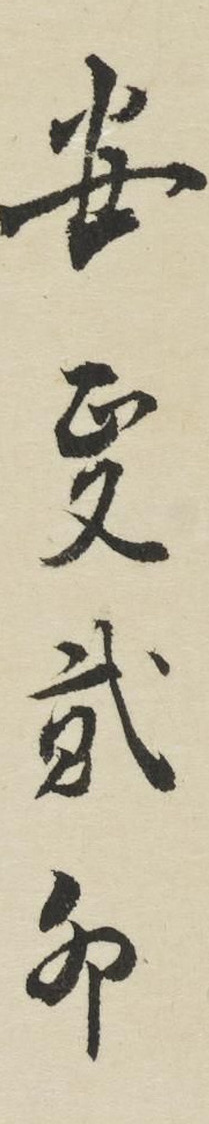安政弐卯
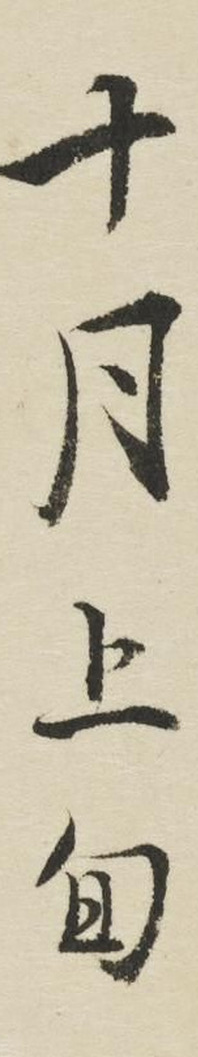十月上旬
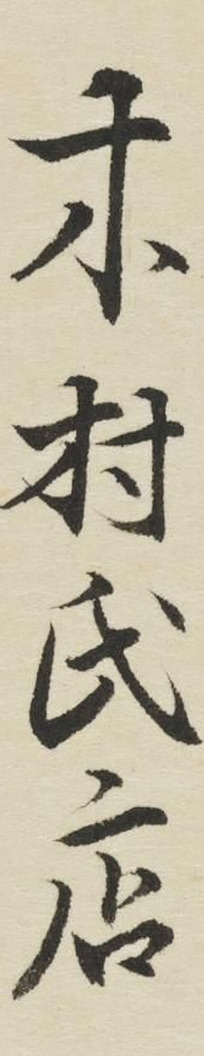木村氏店
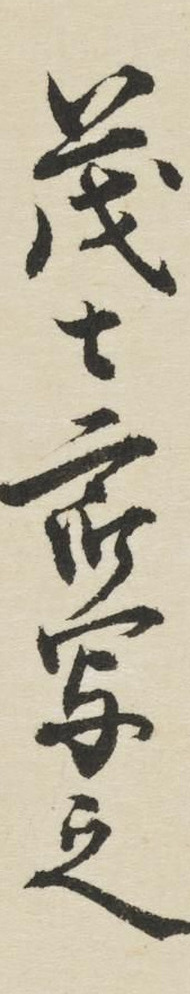茂七郎写之
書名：諸国大地震大津波一代記
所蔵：東京大学地震研究所図書室 Earthquake Research Institute Library, The University of Tokyo, JAPAN
